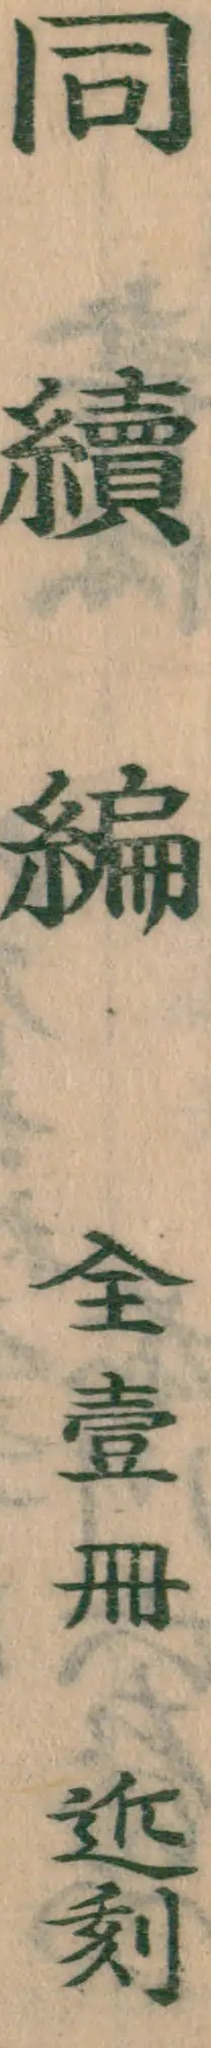同続編全壱冊近刻
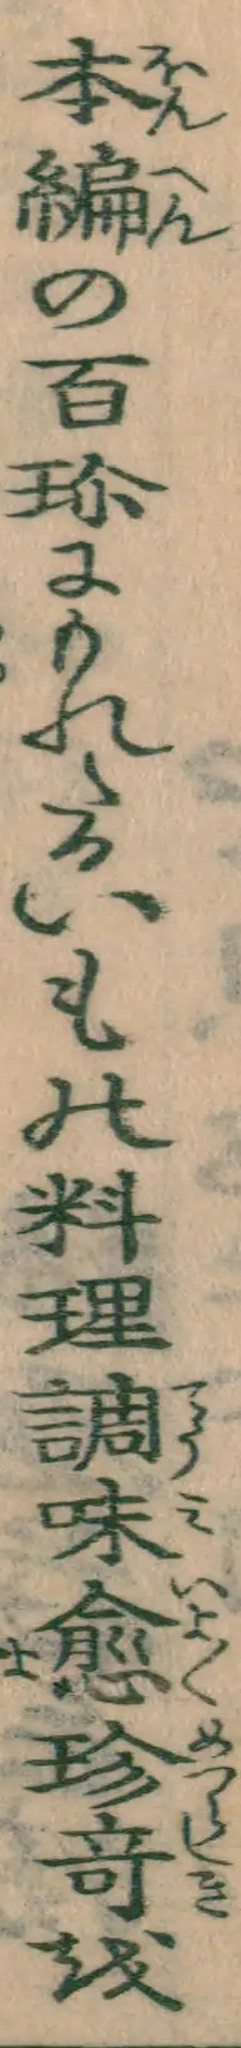本編の百珍にもれたるいもの料理調味愈珍奇を
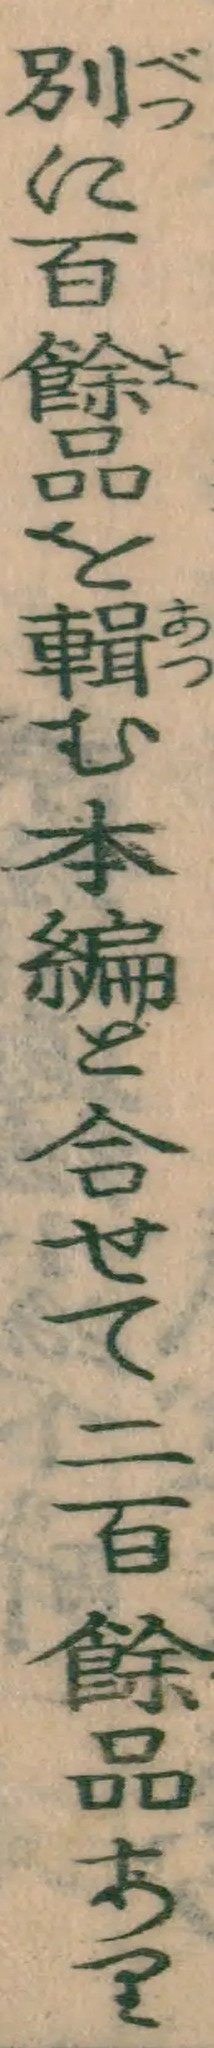別に百余品を輯む本編と合せて二百余品あり
